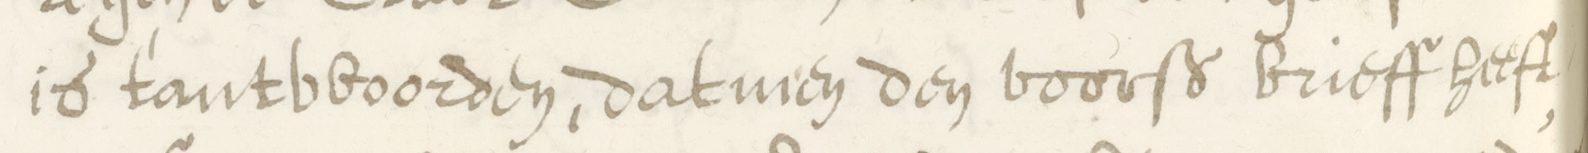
is t'antwoorden, datmen den voors brieff heeft
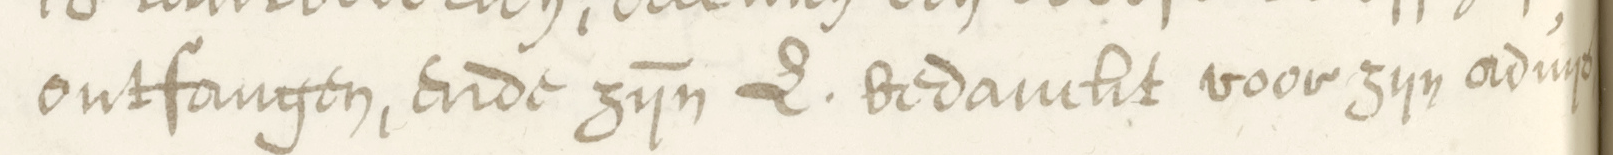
ontfangen, ende zyn L. bedanckt voor zijn aduys
